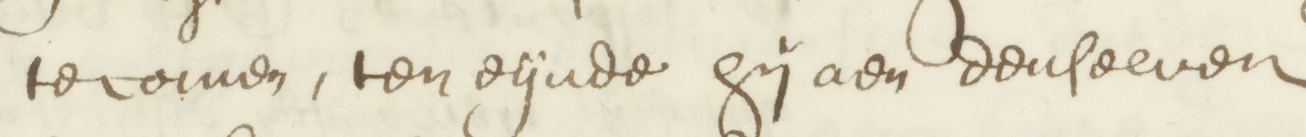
te comen, ten eijnde hij aen denselven
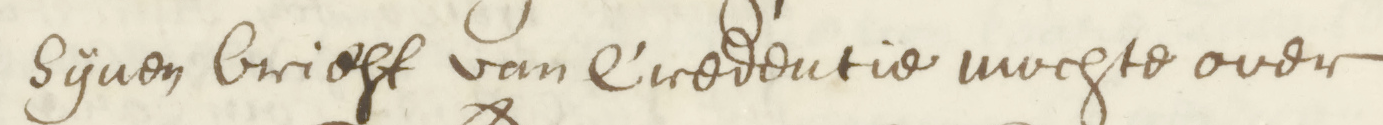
sijnen brieff van Credentie mochte over
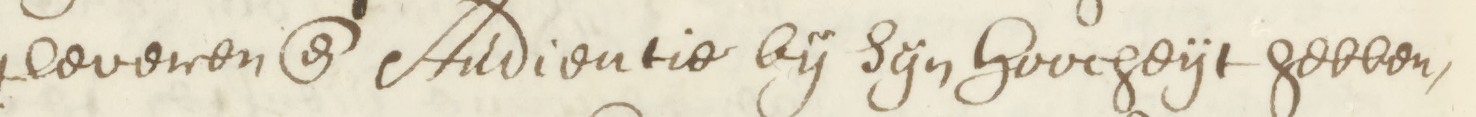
leveren & Audientie bij sijn hoocheijt hebben.
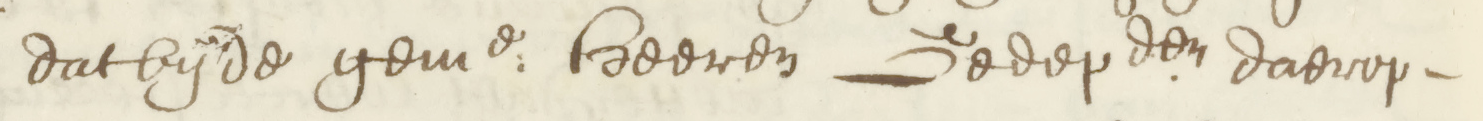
dat bijde geme: heeren Gedepden daerop -
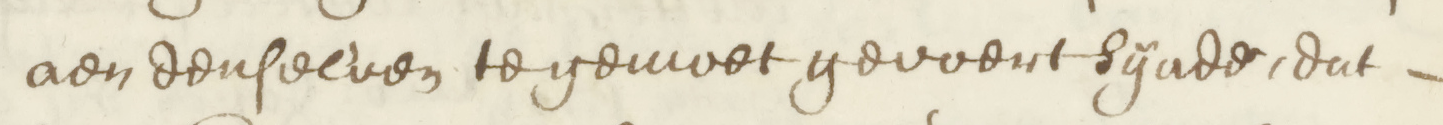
aen denselven te gemoet gevoert sijnde, dat
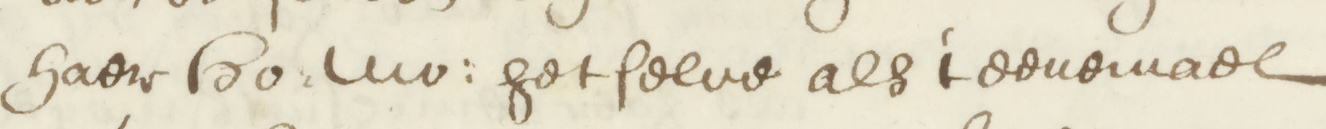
haer ho:mo: het selve als t' eenemael
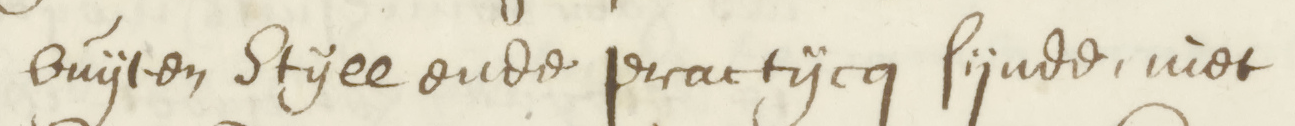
buijten stijll ende practijcq sijnde, niet
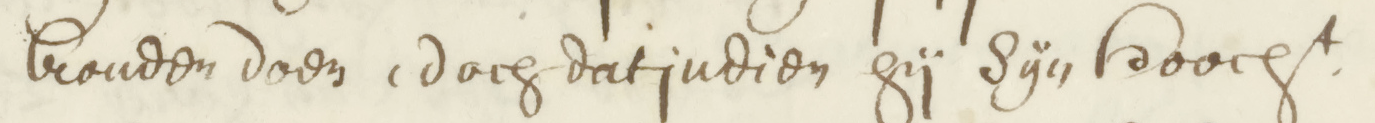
konden doen, doch dat indien hij sijn hoocht
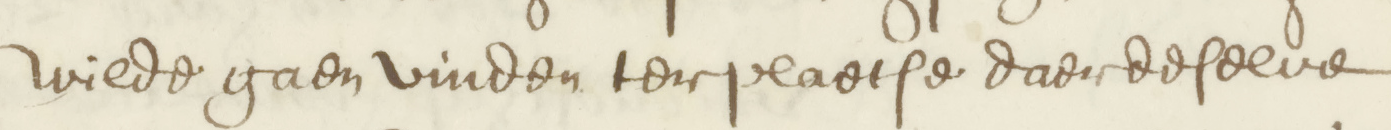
wilde gaen vinden ter plaetse daerdeselve
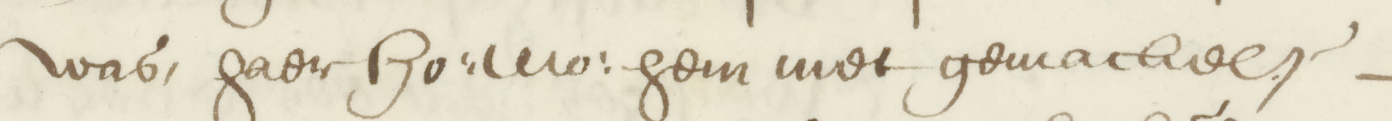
was, haer ho:mo: hem met gemackel
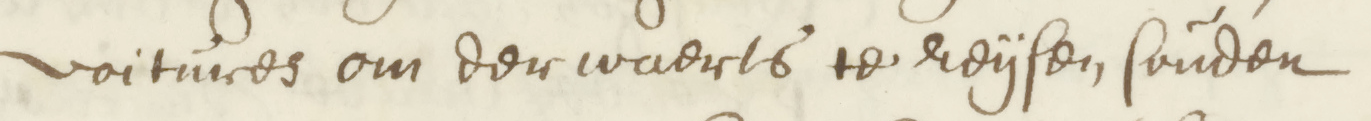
voitures om derwaerts te reijsen souden
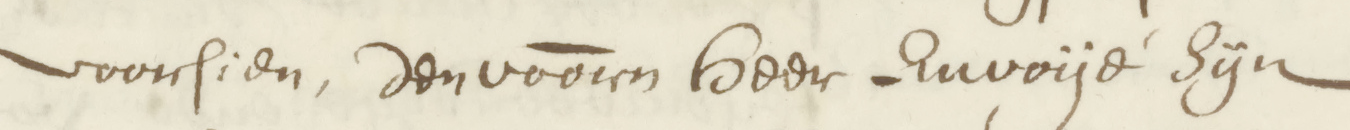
voorsien, den voorn heer Envoijé sijn
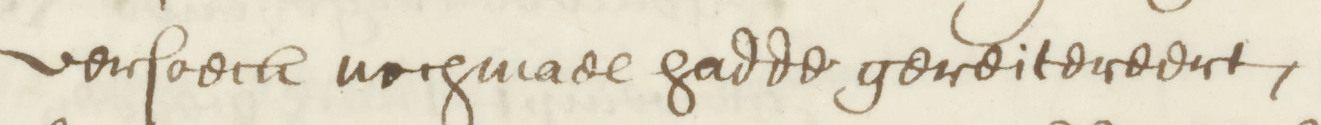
versoeck nochmael hadde gereitereert,
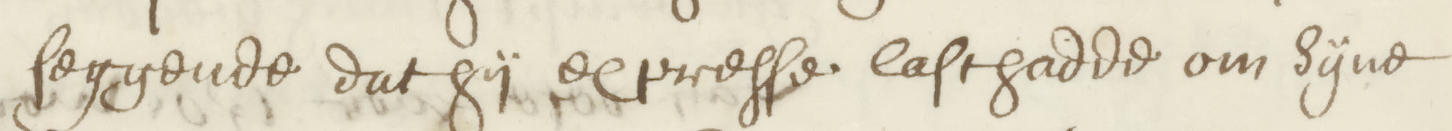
seggende dat hij expresse lasthadde om sijne
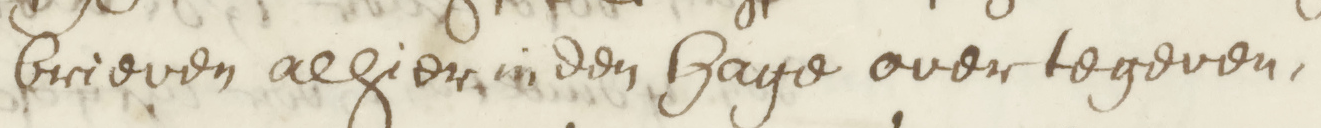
brieven alhier inden hage over te geven,
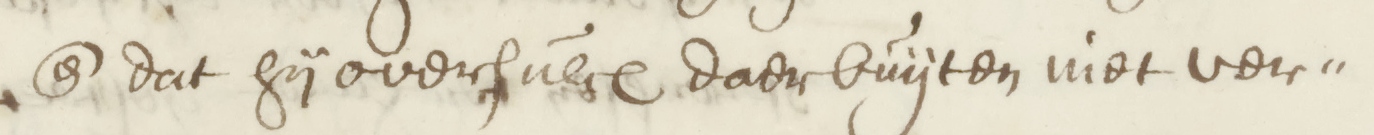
& dat hij oversulcx daerbuijten niet ver„
